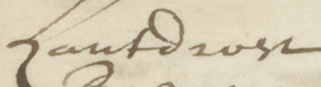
Lantdrost
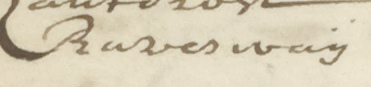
Raveswaij
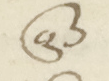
Ca.
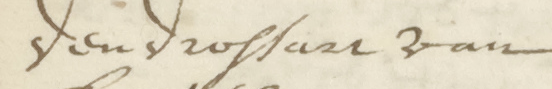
Den drossart van
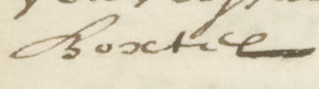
Boxtel
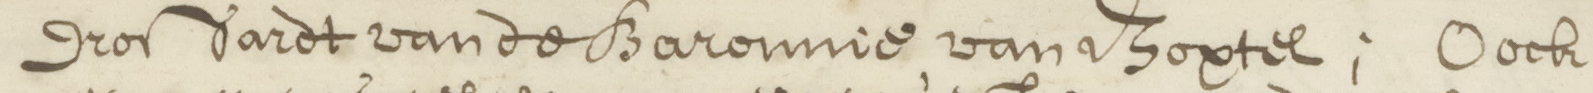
Drossardt van de Baronnie van Boxtel; Oock
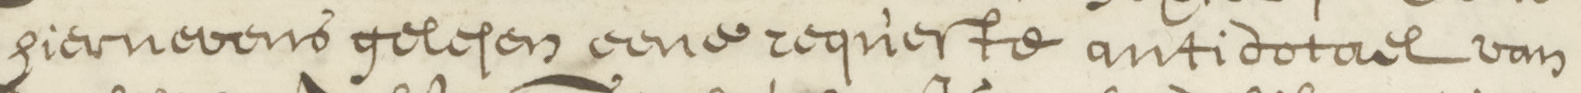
hiernevens gelesen eene requeste antidotael van
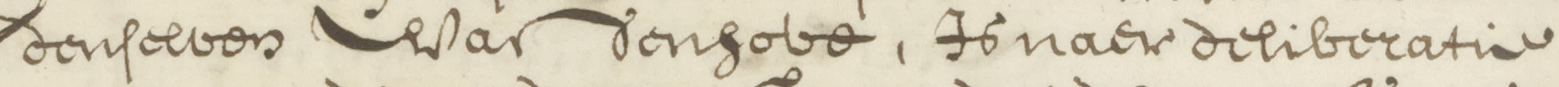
denselven Wassenhove. Is naer deliberatie
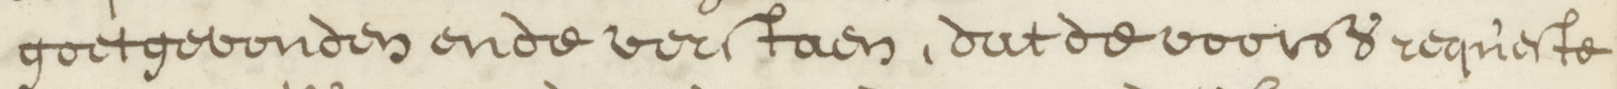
goetgevonden ende verstaen, dat de voors requeste
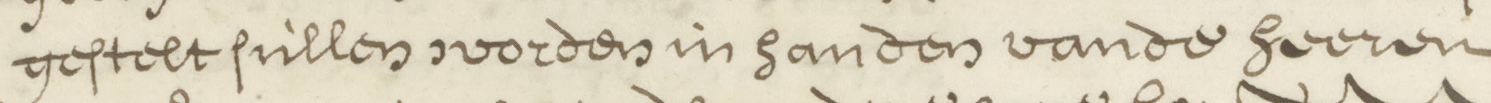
gestelt sullen worden in handen vande heeren
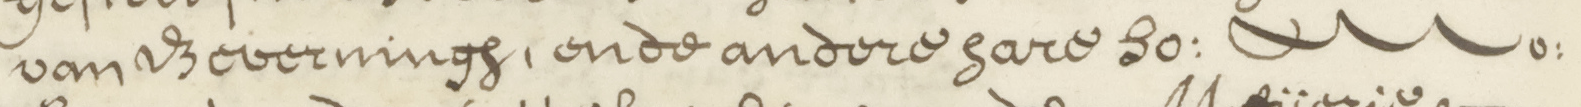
van Beverningh, ende andere hare ho:Mo:
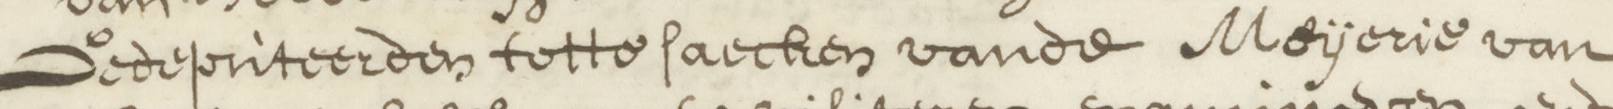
Gedeputeerden totte saecken vande Meijerie van
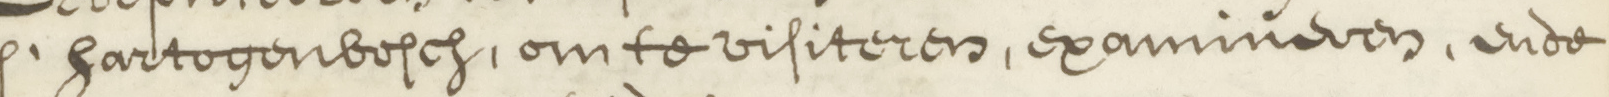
s'hartogenbosch, om te visiteren, examineren, ende
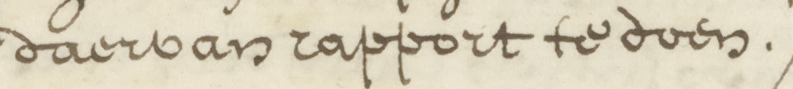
daervan rapport te doen.
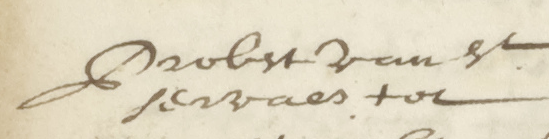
Probst van St.
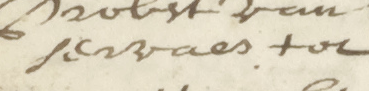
servaes tot
